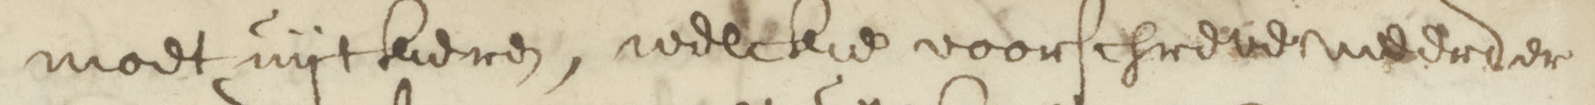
moet uijtkeren, welcke voorschreve meerder
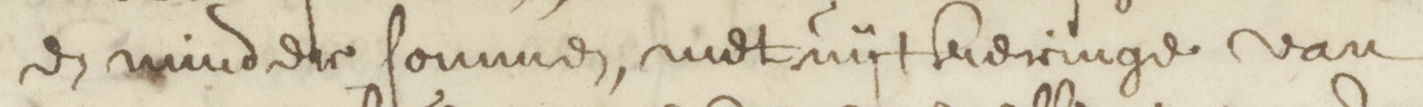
en minder sommen, met uijtkeringe van
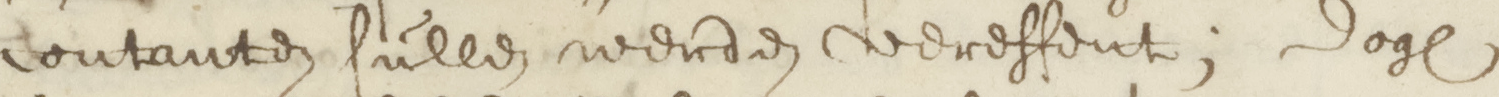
contanten sullen werden vereffent; Dogh
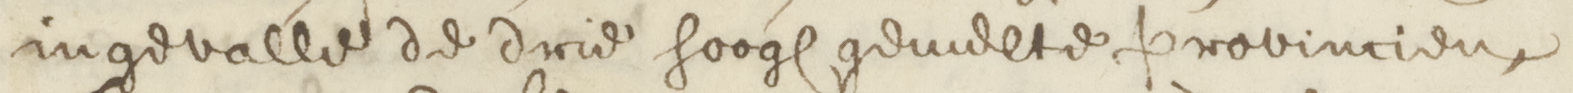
ingevalle de drie hoogh gemelte provincien,
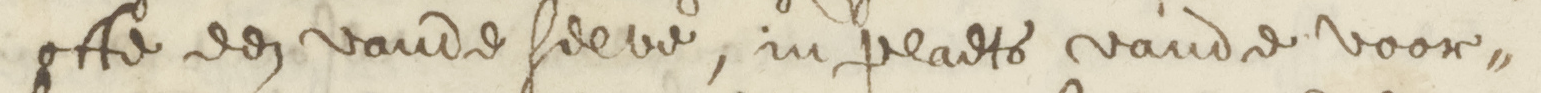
ofte een vande selve, in plaets vande voor„
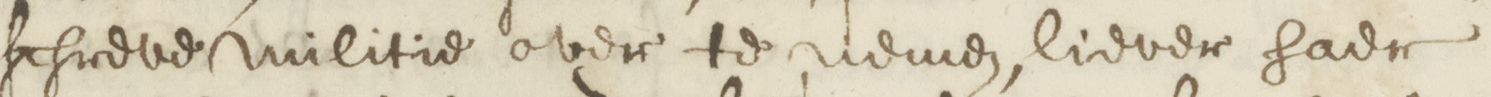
schreve militie over te nemen, liever haer
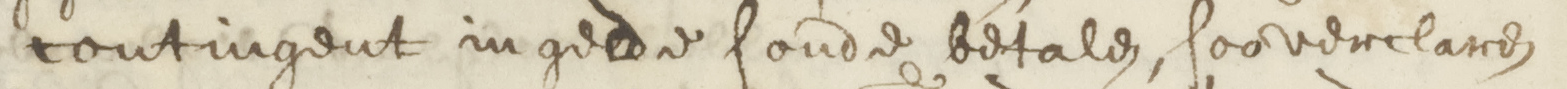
contingent in gelde soude betalen, soo verclaren
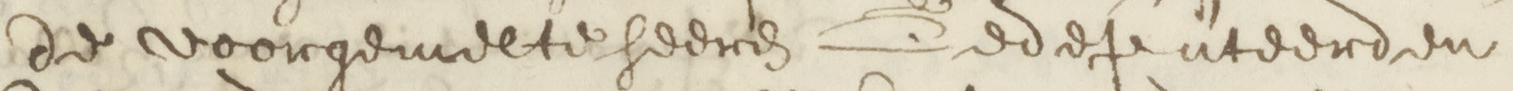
de voorgemelte heeren Gedeputeerden
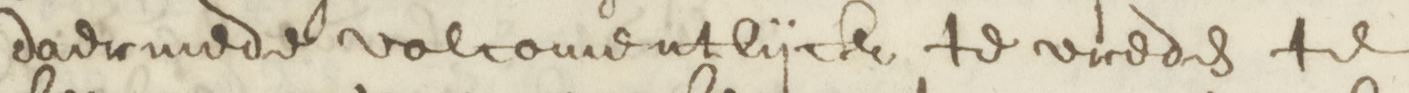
daer mede volcomentlijck te vreden te
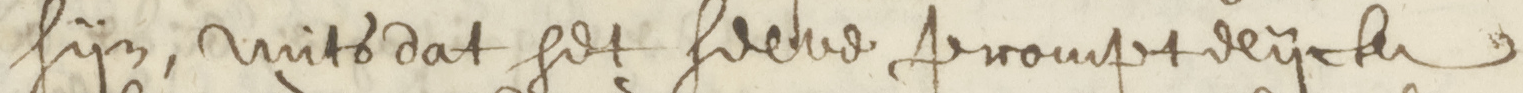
sijn, mitsdat het selve promptelijck
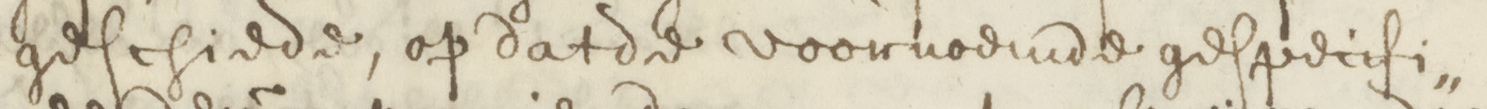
geschiede, op dat de voornoemde gespecifi„
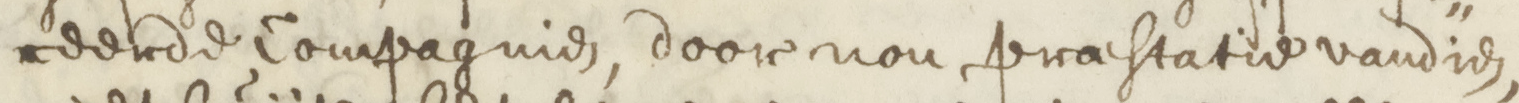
ceerde Compagnien, door non præstatie vandien,
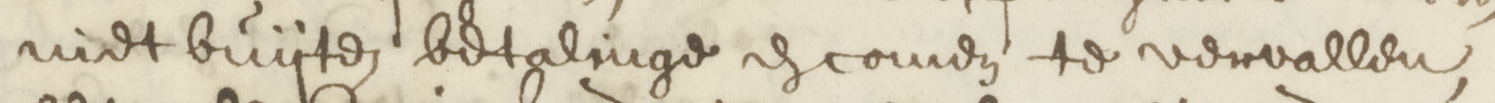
niet buijten betalinge en comen te vervallen,
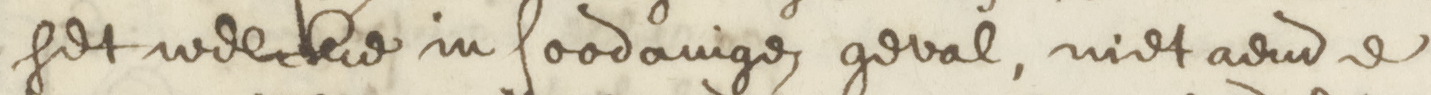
het welcke in soodanigen geval, niet aende
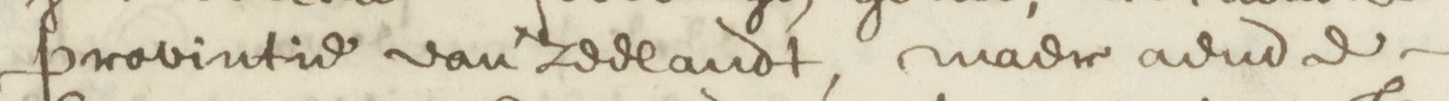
provintie van Zeelandt, maer aende
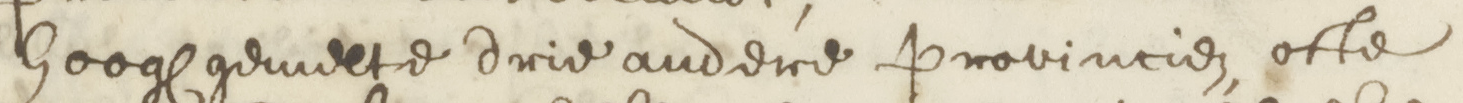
hooghgemelte drie andere Provincien, ofte
